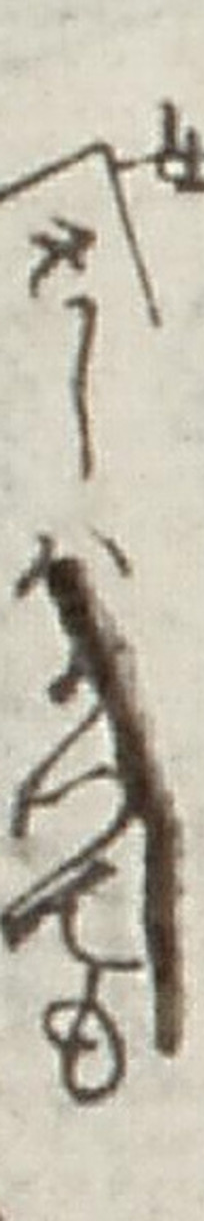〽としはよつても
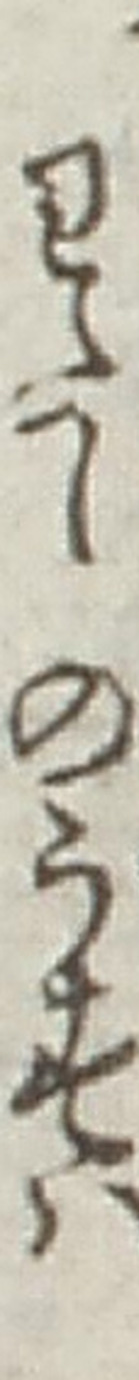わたしのうたは
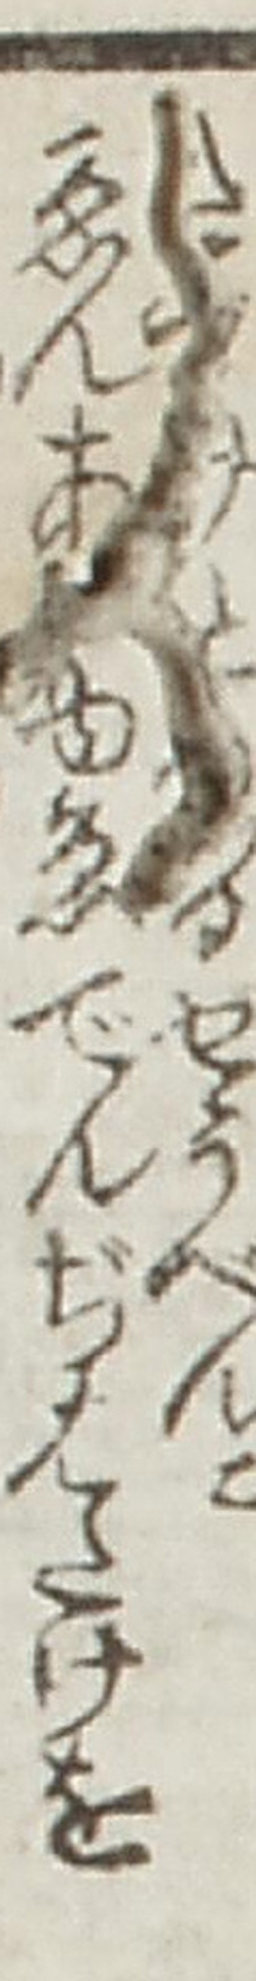ゑんあゆゑでんぢはたけを
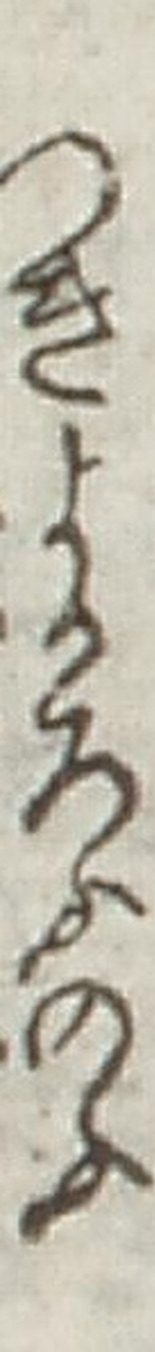つきよかろうのう
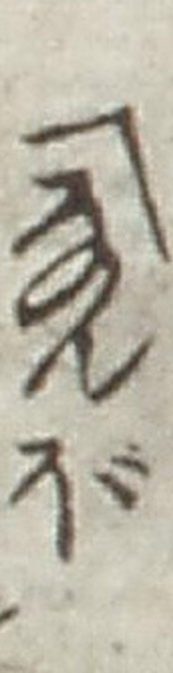〽なんぼ
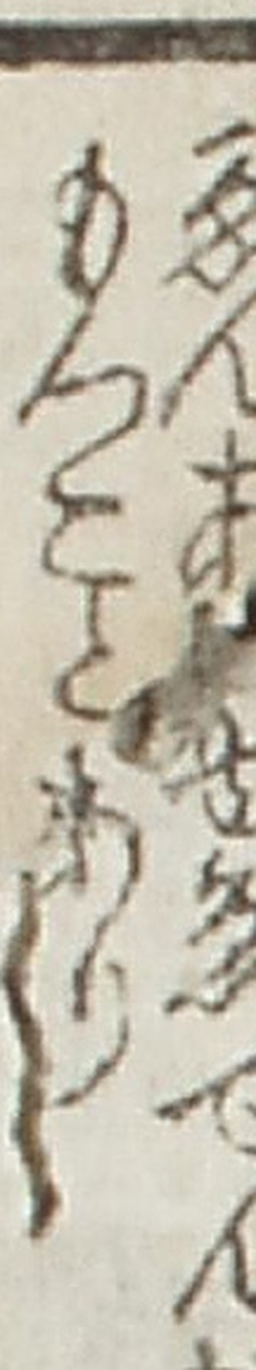もつことあり
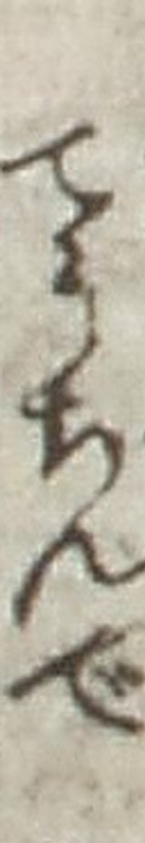てうちんで
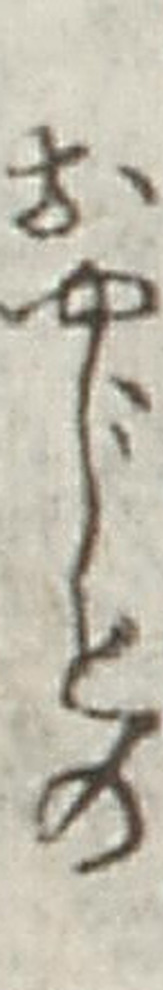おやじとの
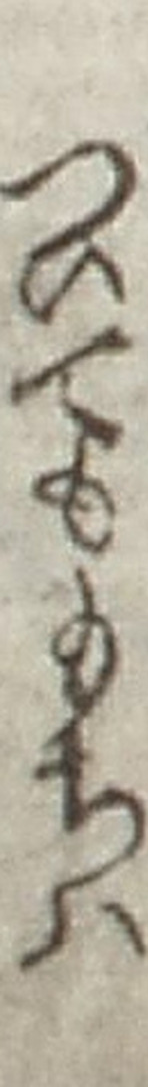ついてももちは
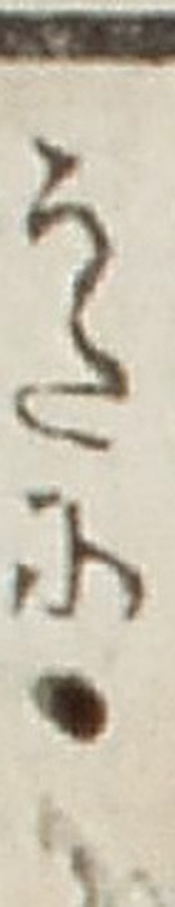うたに
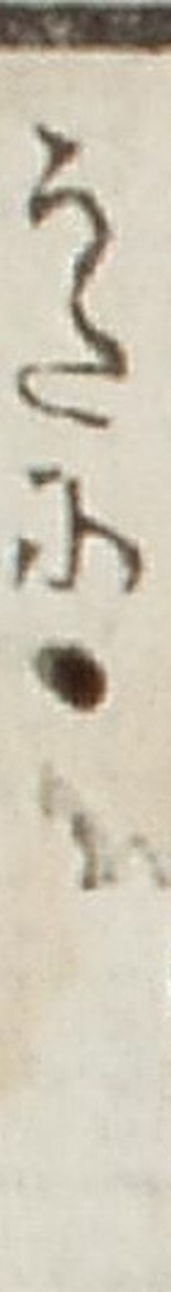うたに
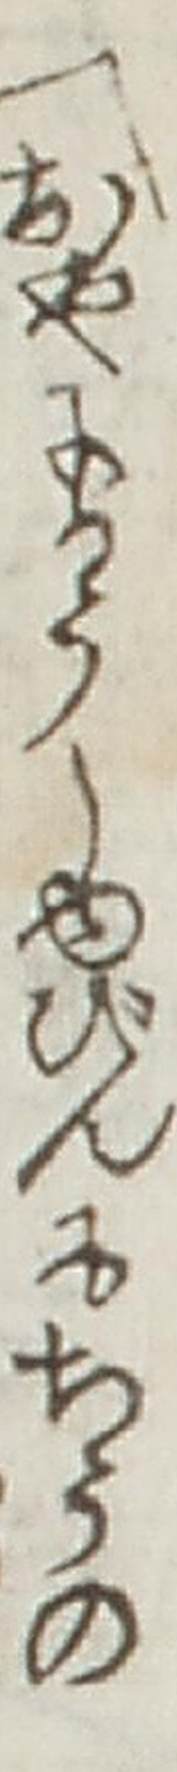〽おやにかうしゆびんにちうの
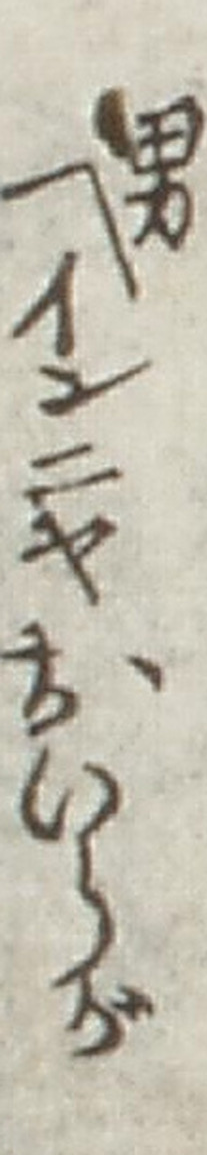〽インニヤおいらが
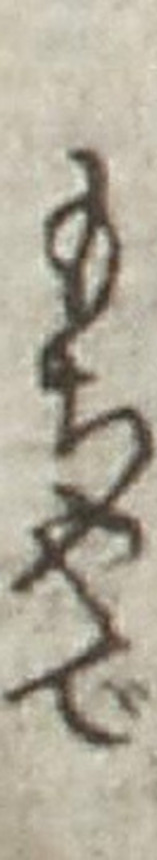もちやで
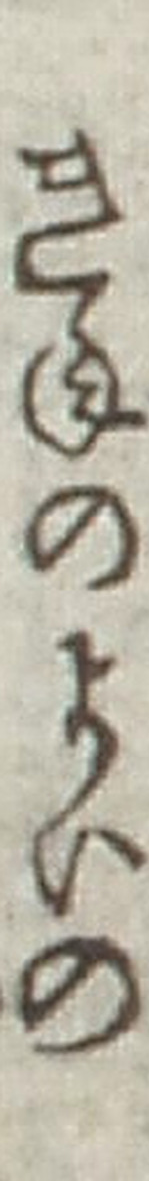きねのよいの
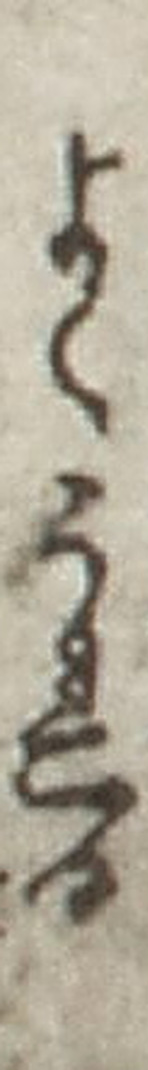よくうれる
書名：三世相出雲當座帳　上下冊
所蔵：東京大学地震研究所図書室 Earthquake Research Institute Library, The University of Tokyo, JAPAN
